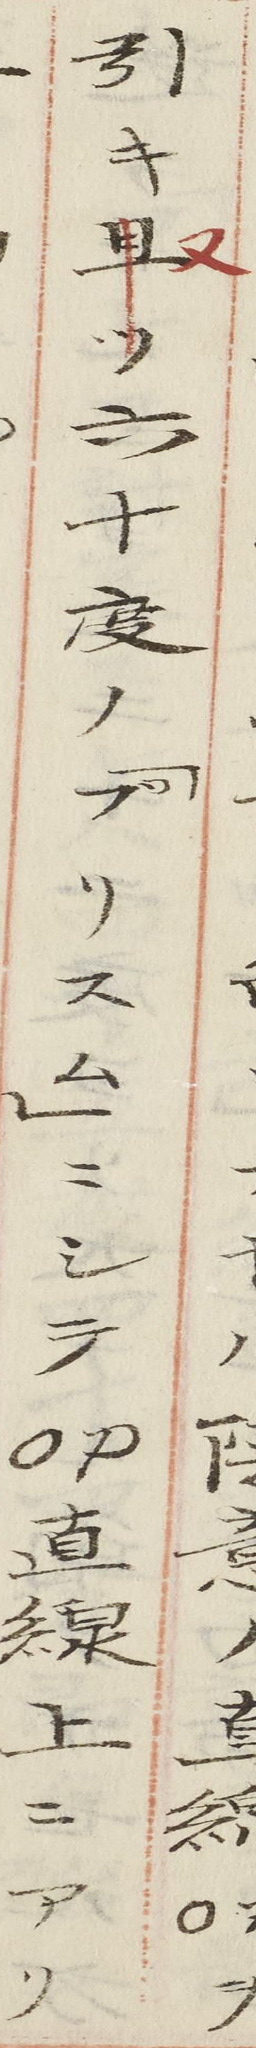引キ且ツ六十度ノ「プリスム」ニシテＯＰ直線上ニアリ
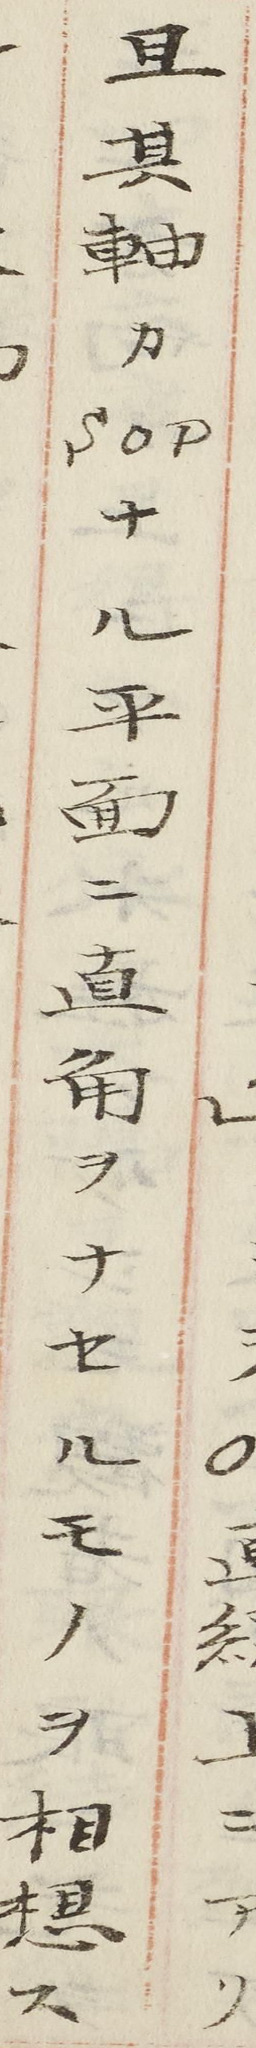且其軸カＳＯＰナル平面ニ直角ヲナセルモノヲ相想ス
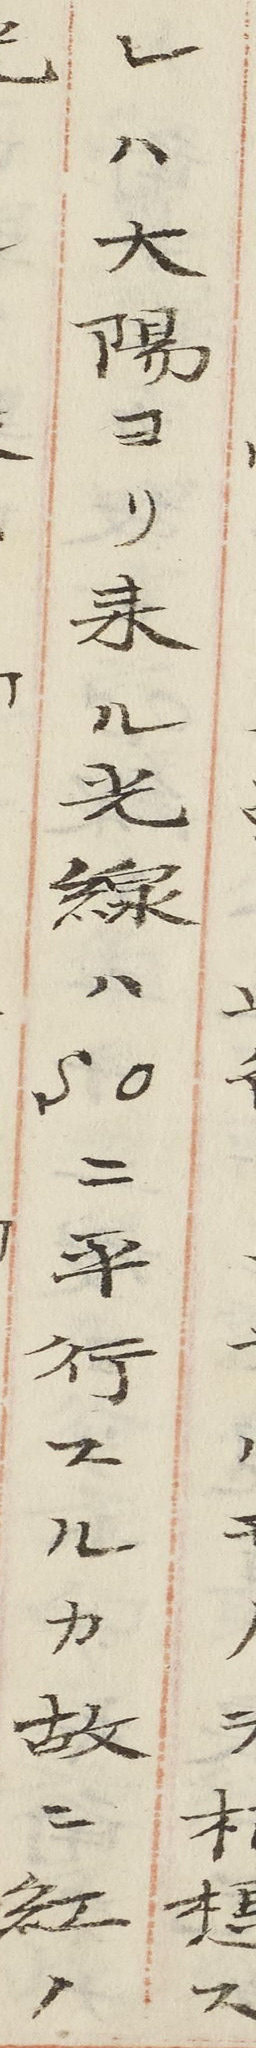レハ大陽ヨリ来ル光線ハＳＯニ平行スルカ故ニ紅ノ
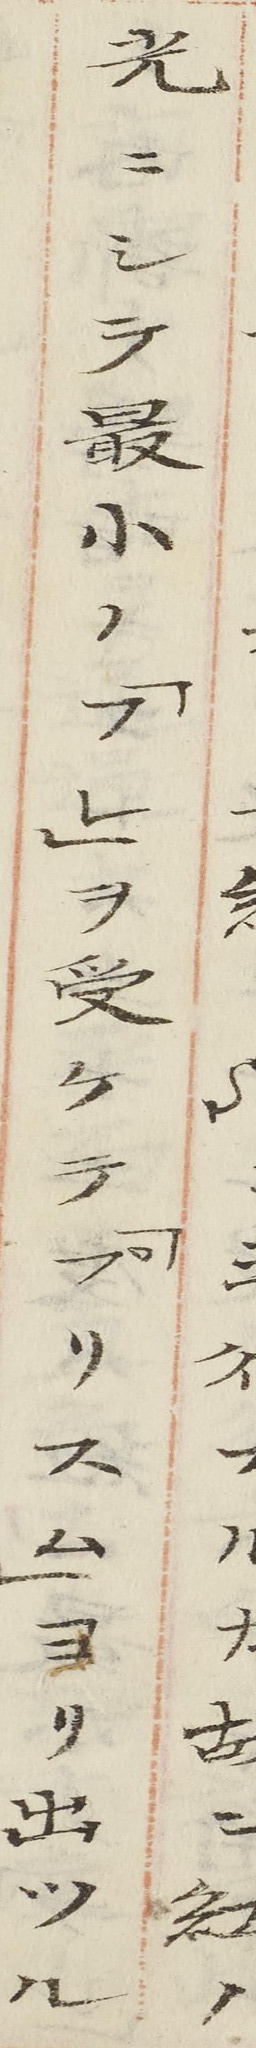光ニシテ最小ノ「フレ」ヲ受ケテ「プリスム」ヨリ出ツル
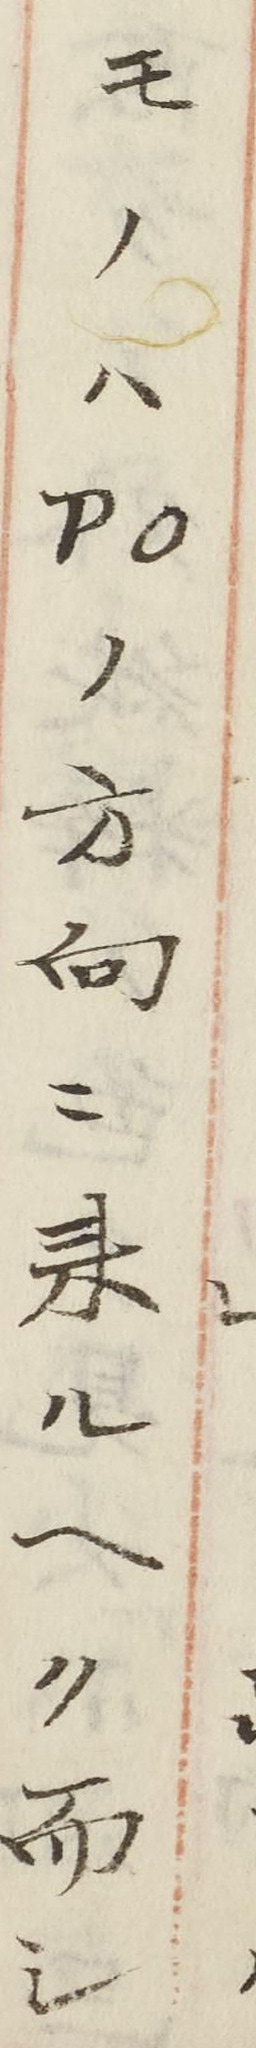第モノハＰＯノ方向ニ来ルヘク而シ
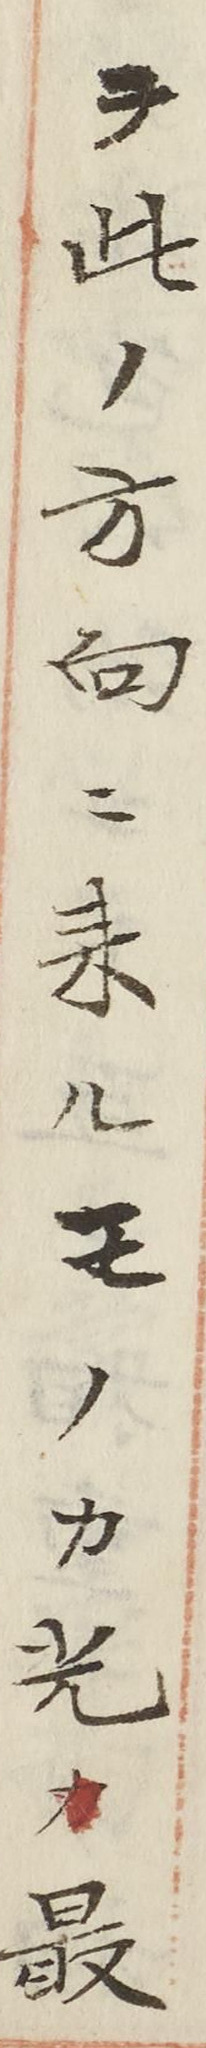九テ此ノ方向ニ来ルモノカ光カ最
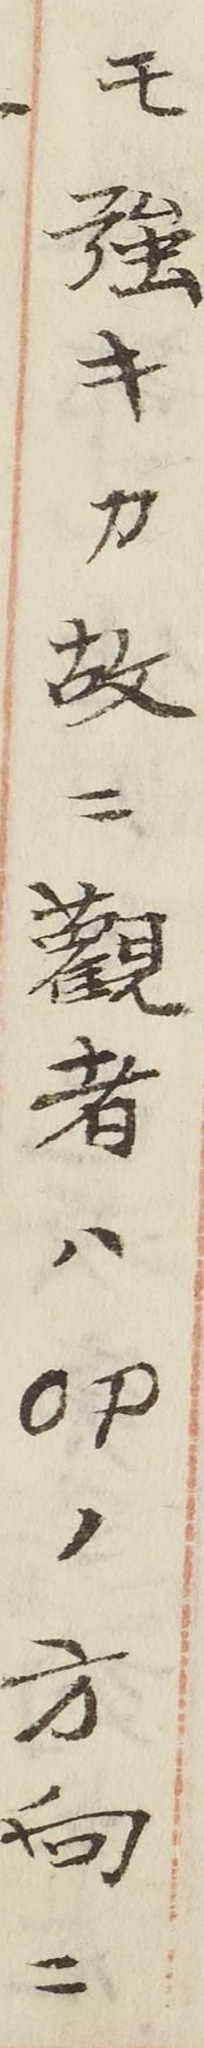図モ強キカ故ニ観者はＯＰノ方向ニ
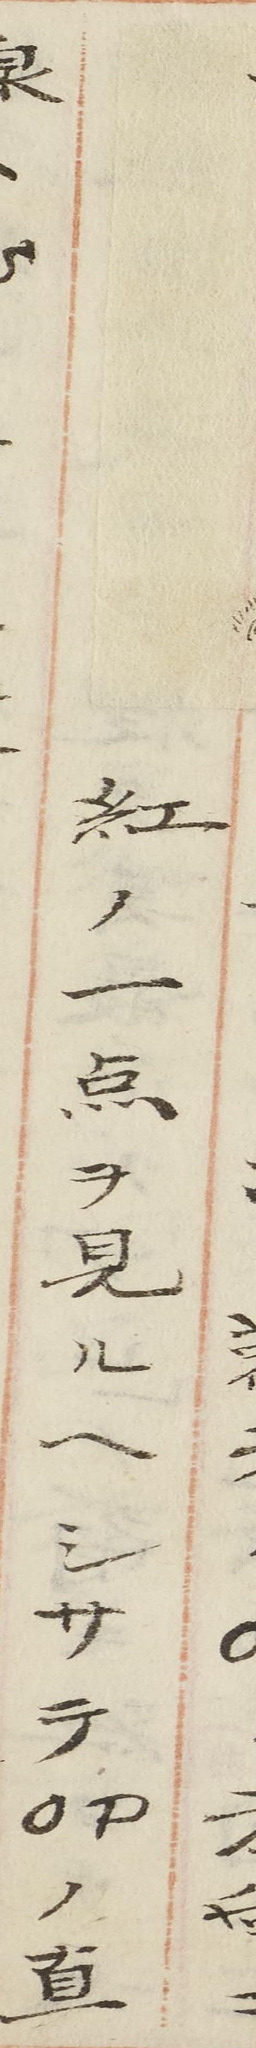紅ノ一点ヲ見ルヘシサテＯＰノ直
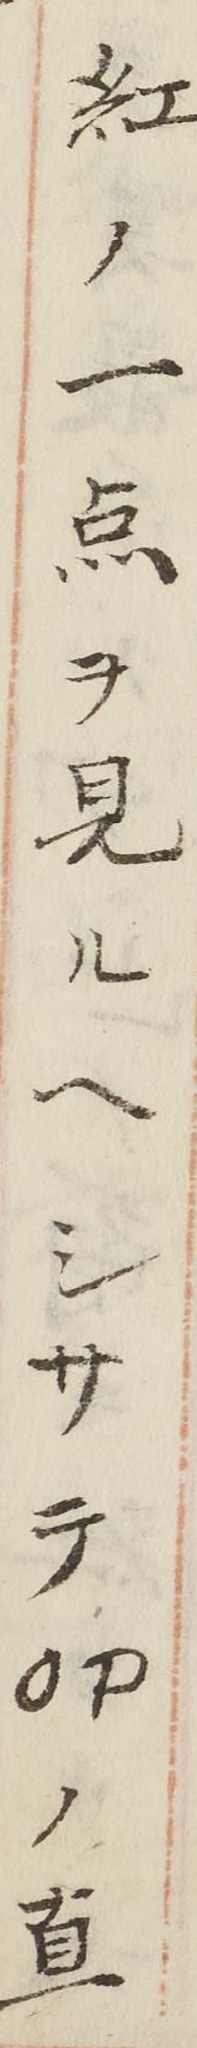紅ノ一点ヲ見ルヘシサテＯＰノ直
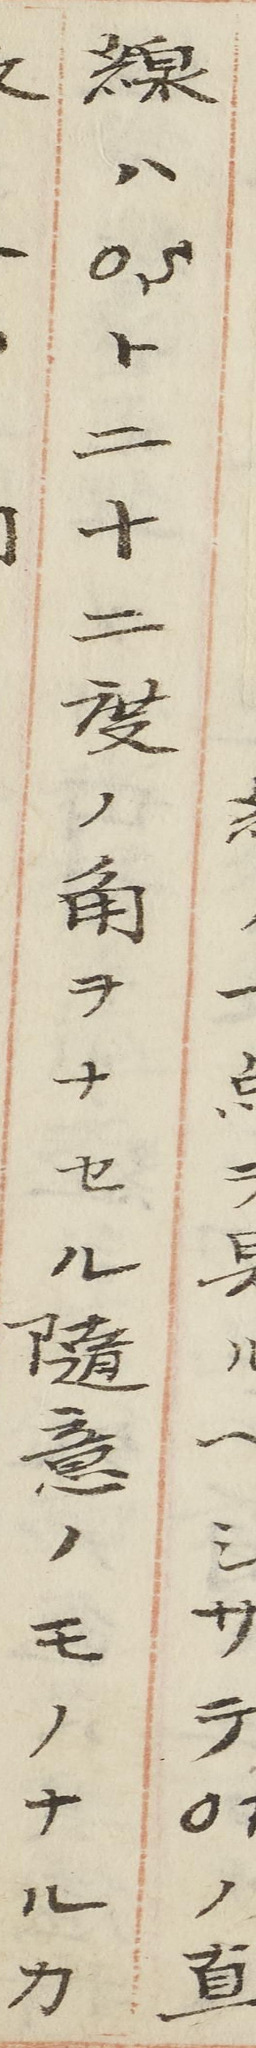線ハＯＳト二十二度ノ角ヲナセル随意ノモノナルカ
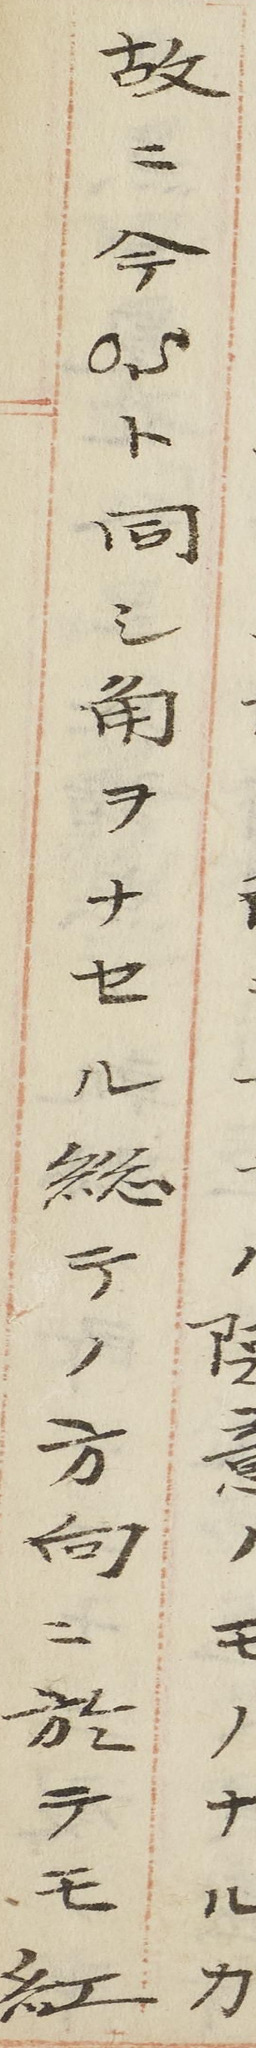故ニ今ＯＳト同シ角ヲナセル総テノ方向ニ於テモ紅

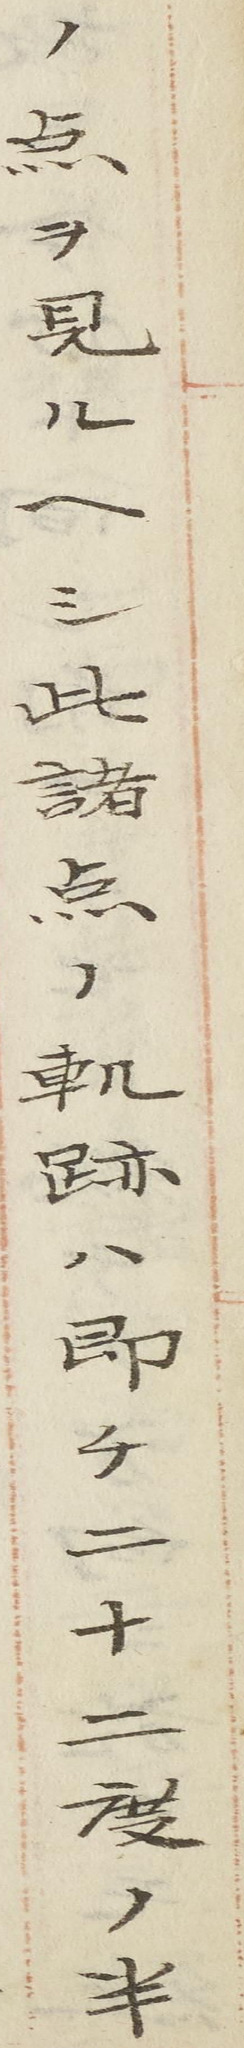ノ点ヲ見ルヘシ此諸点ノ軌跡ハ即チ二十二度ノ半
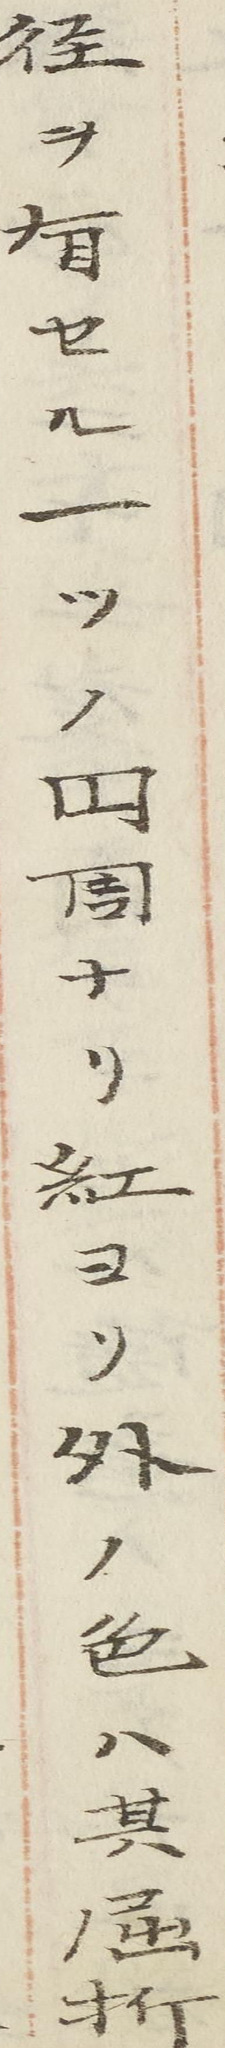径ヲ有セル一ツノ円周ナリ紅ヨリ外ノ色ハ其屈折
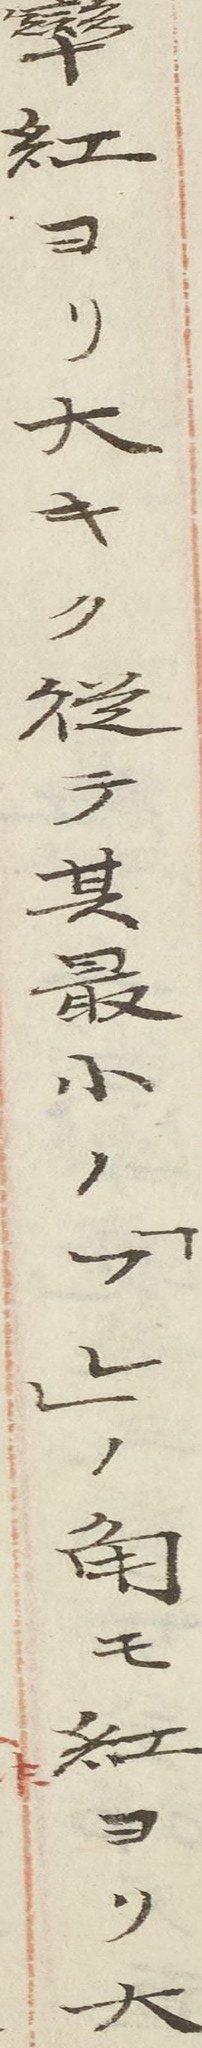率紅ヨリ大キク従テ其最小ノ「フレ」ノ角モ紅ヨリ大
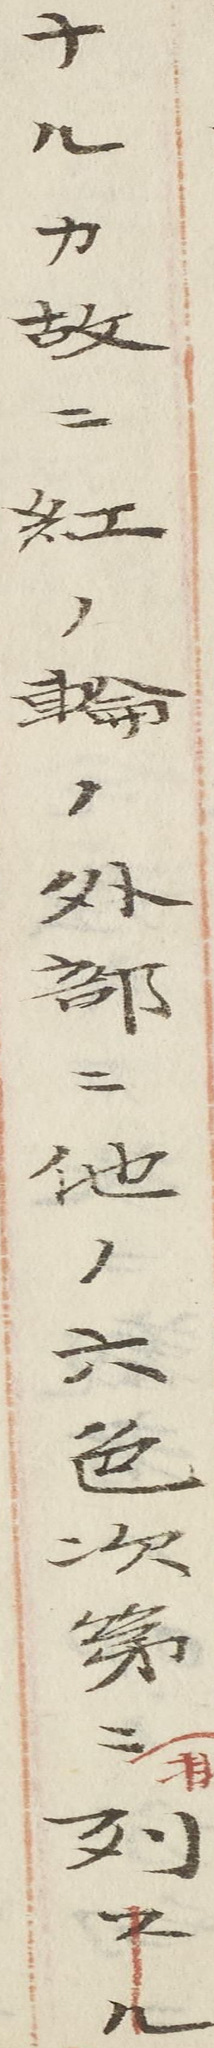ナルカ故ニ紅ノ輪ノ外部ニ他ノ六色次第ニ列スル
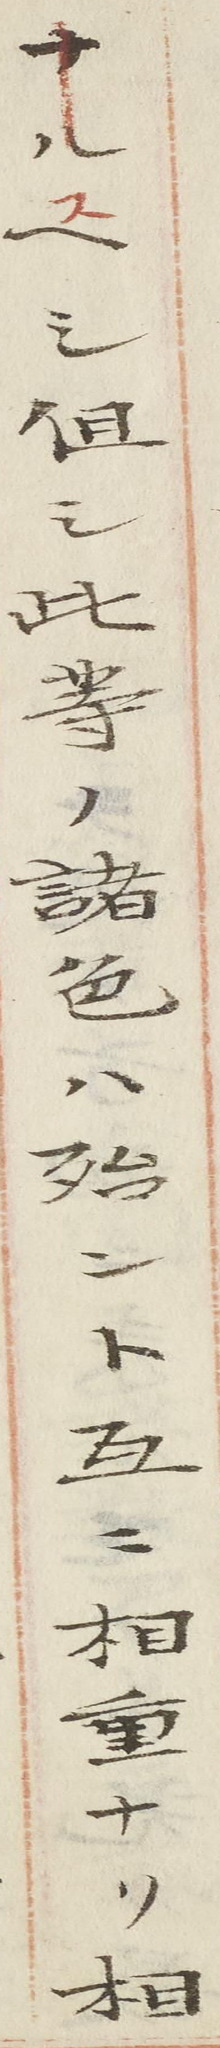ナルヘシ但シ此等ノ諸色ハ殆ント互ニ相重ナリ相
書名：虹及ハロノ説明
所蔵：東京大学地震研究所図書室 Earthquake Research Institute Library, The University of Tokyo, JAPAN
